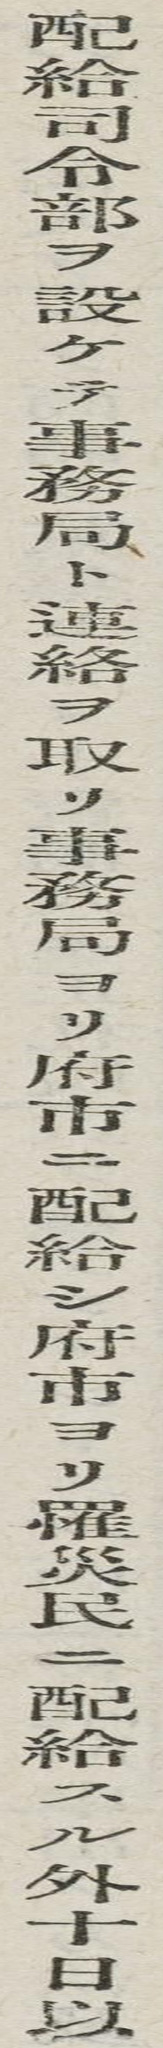配給司令部ヲ設ケテ事務局ト連絡ヲ取リ事務局ヨリ府市ニ配給シ府市ヨリ罹災民ニ配給スル外十日以
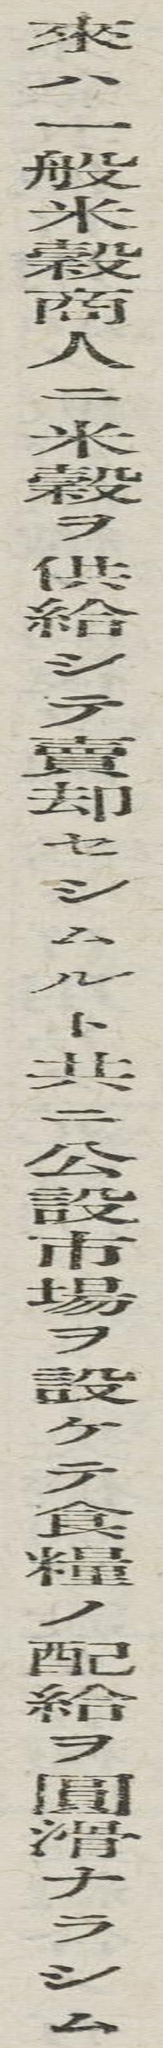来ハ一般米穀商人ニ米穀ヲ供給シテ売却セシムルト共ニ公設市場ヲ設ケテ食糧ノ配給ヲ円滑ナラシム
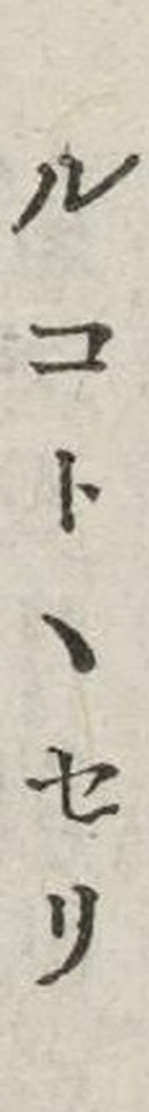ルコトヽセリ
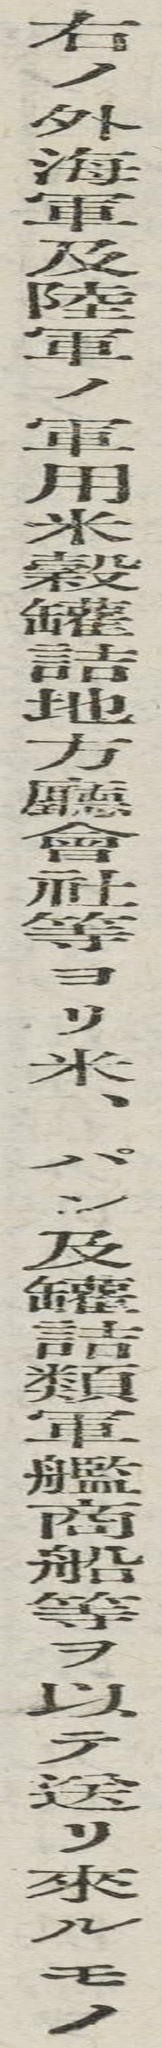右ノ外海軍及陸軍ノ軍用米穀缶詰地方庁会社等ヨリ米、パン及缶詰類軍艦商船等ヲ以テ送リ来ルモノ
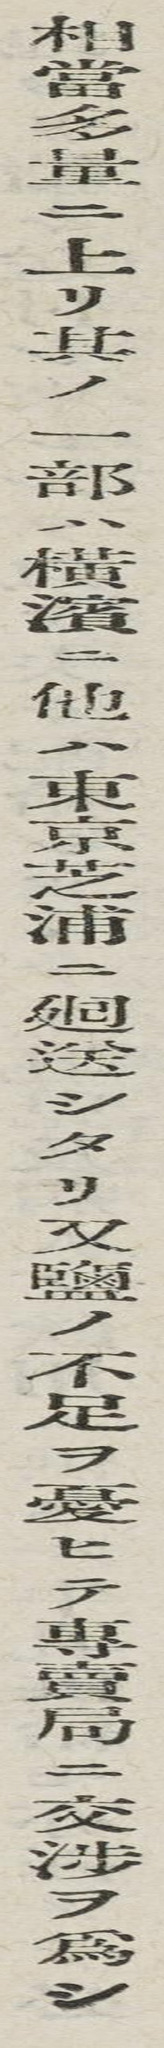相当多量ニ上リ其ノ一部ハ横浜ニ他ハ東京芝浦ニ回送シタリ又塩ノ不足ヲ憂ヒテ専売局ニ交渉ヲ為シ
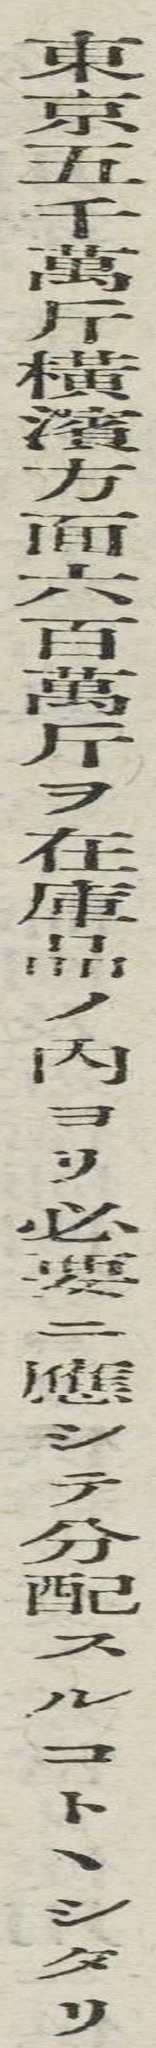東京五千万斤横浜方面六百万斤ヲ在庫品ノ内ヨリ必要ニ応シテ分配スルコトヽシタリ

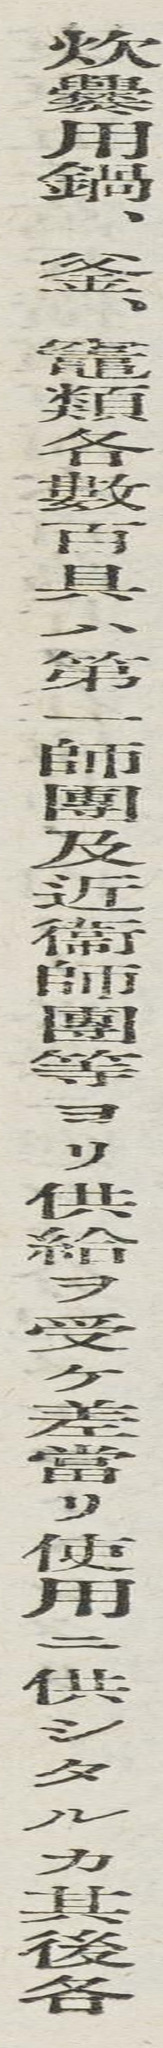炊爨用鍋、釜、竈類各数百具ハ第一師団及近衛師団等ヨリ供給ヲ受ケ差当リ使用ニ供シタルカ其後各
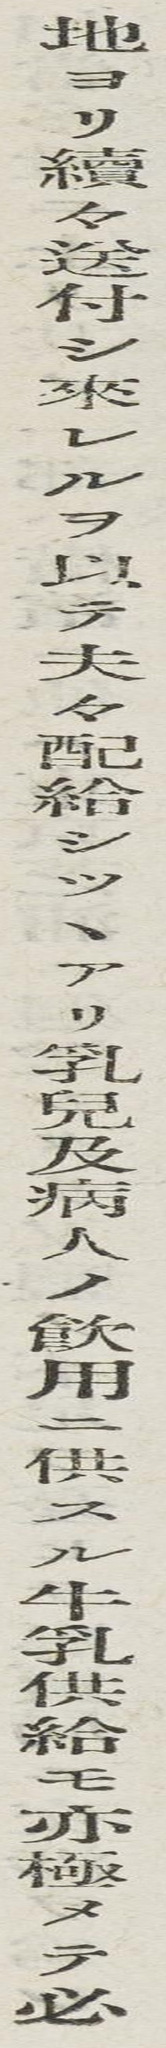地ヨリ続々送付シ来レルヲ以テ夫々配給シツヽアリ乳児及病人ノ飲用ニ供スル牛乳供給モ亦極メテ必
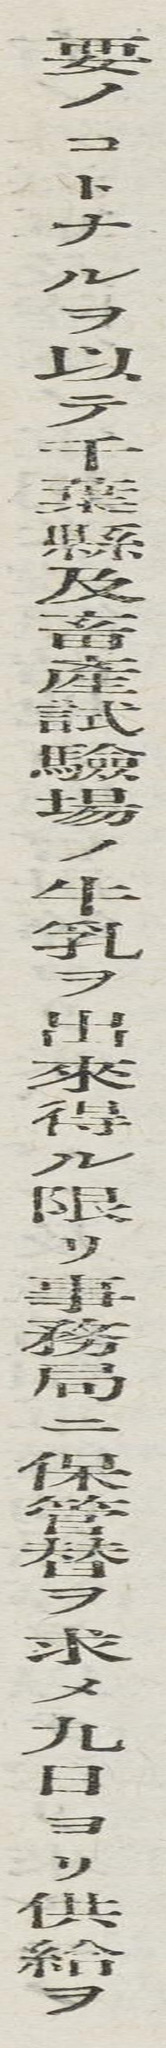要ノコトナルヲ以テ千葉県及畜産試験場ノ牛乳ヲ出来得ル限リ事務局ニ保管替ヲ求メ九日ヨリ供給ヲ
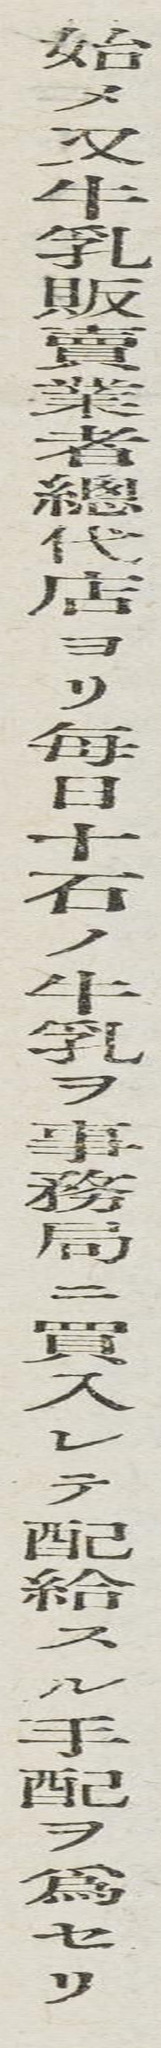始メ又牛乳販売業者総代店ヨリ毎日十石ノ牛乳ヲ事務局ニ買入レテ配給スル手配ヲ為セリ
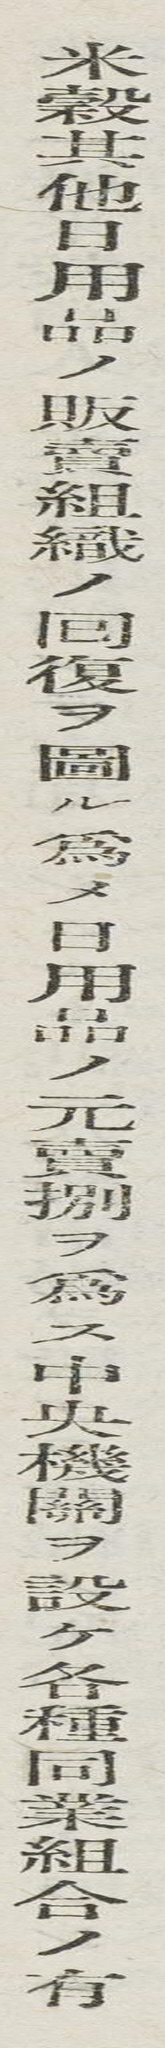米殻其他日用品ノ販売組織ノ回復ヲ図ル為メ日用品ノ元売捌ヲ為ス中央機関ヲ設ケ各種同業組合ノ有
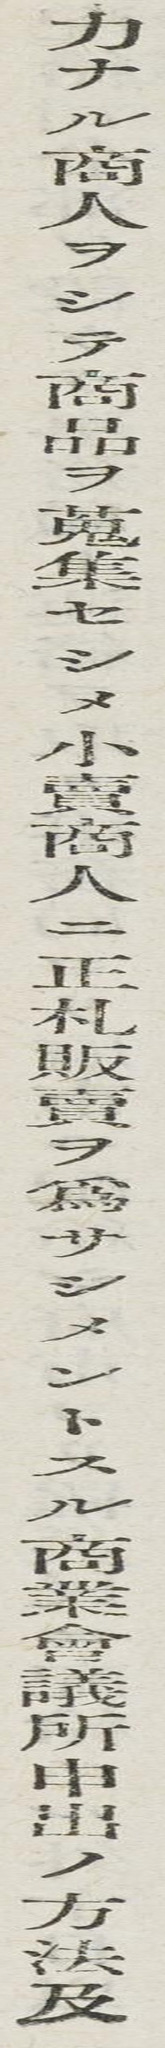力ナル商人ヲシテ商品ヲ蒐集セシメ小売商人ニ正札販売ヲ為サシメントスル商業会議所申出ノ方法及
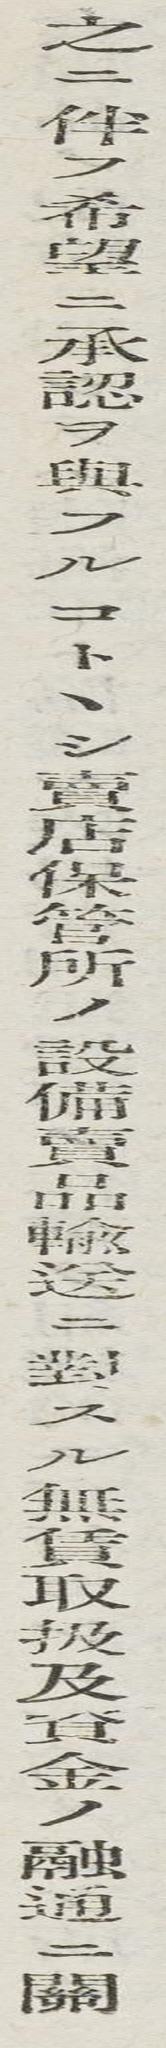之ニ伴フ希望ニ承認ヲ与フルコトヽシ売店保管所ノ設備売品輸送ニ対スル無賃取扱及資金ノ融通ニ関
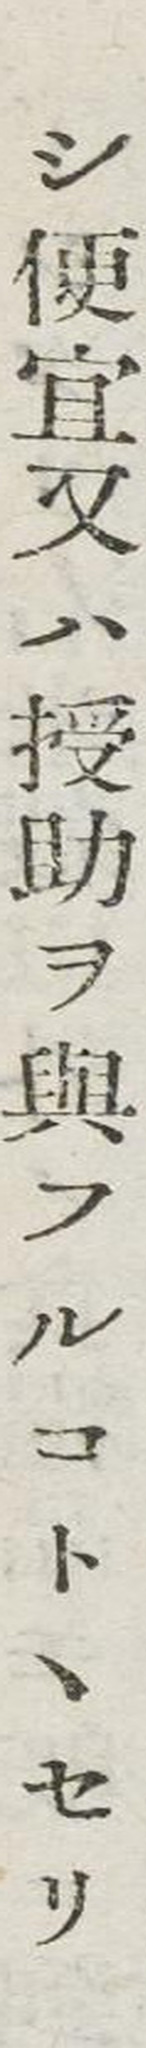シ便宜又ハ援助ヲ与フルコトヽセリ
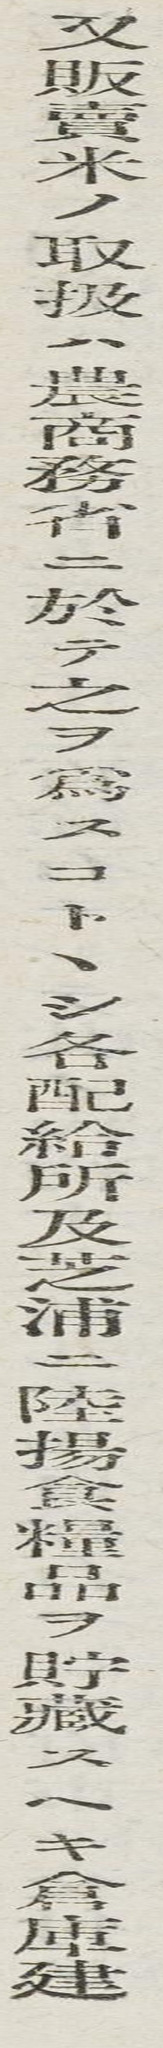又販売米ノ取扱ハ農商務省ニ於テ之ヲ為スコトヽシ各配給所及芝浦ニ陸揚食糧品ヲ貯蔵スヘキ倉庫建
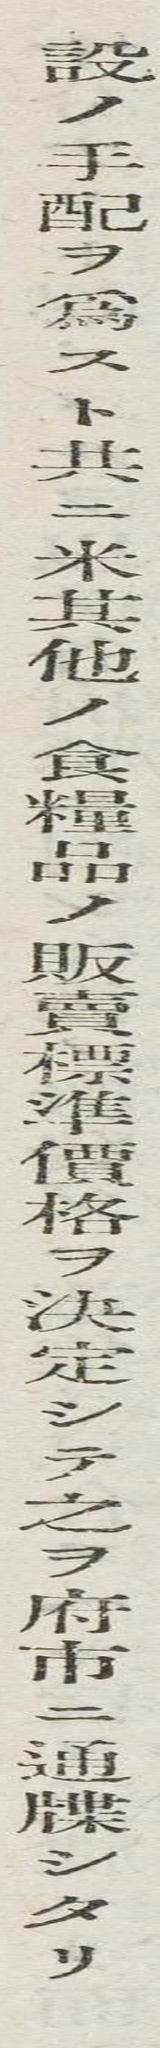設ノ手配ヲ為スト共ニ米其他ノ食糧品ノ販売標準価格ヲ決定シテ之ヲ府市ニ通牒シタリ
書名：震災被害状況並救護施設概要
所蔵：東京大学地震研究所図書室 Earthquake Research Institute Library, The University of Tokyo, JAPAN
